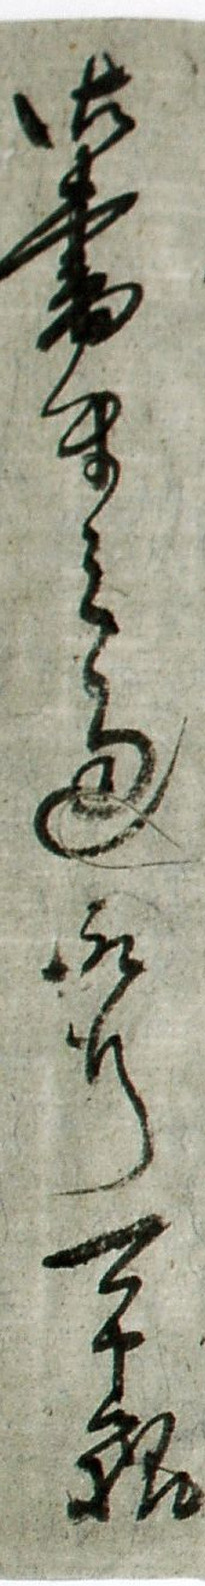御書付之通取引可申候様
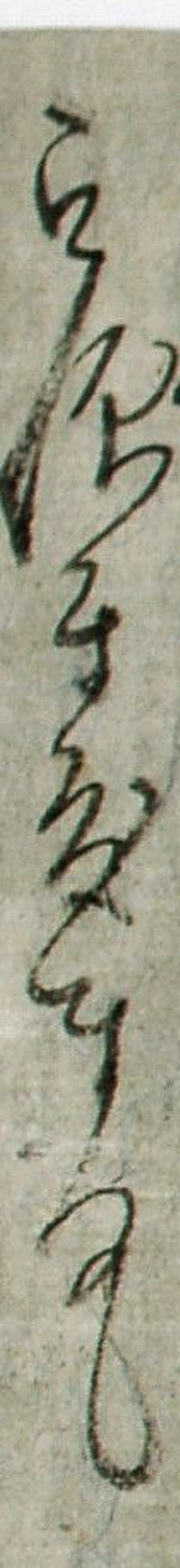被仰付度奉存候

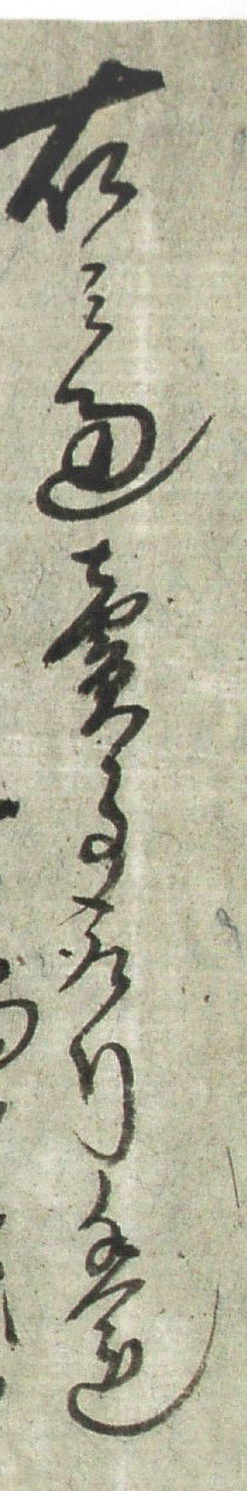右之通売事取引手運
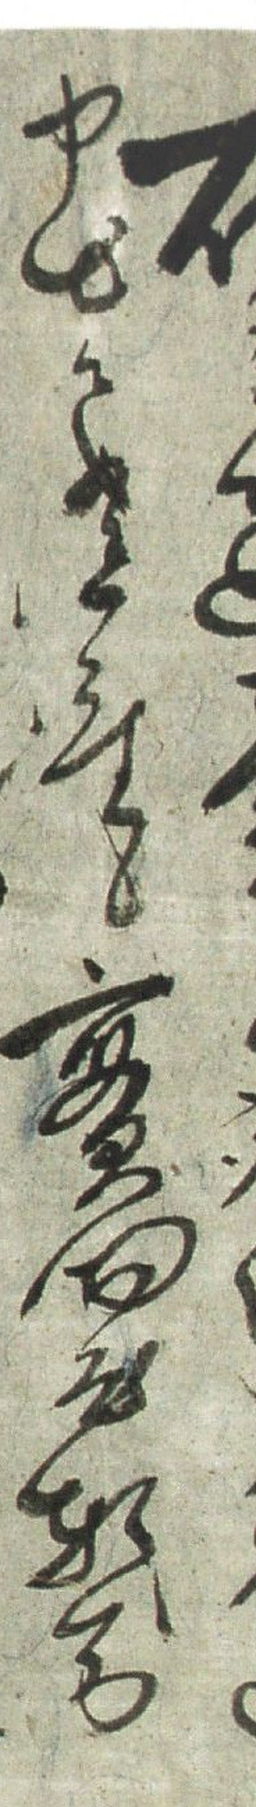申出候義に御座候実問屋軒別
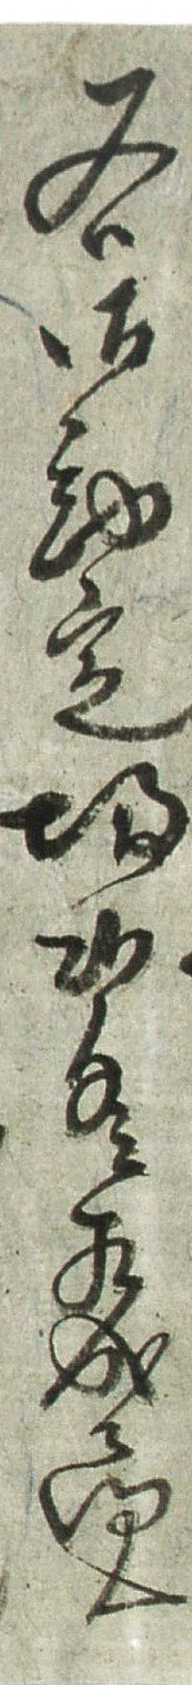又は御勘定場弐手に相成候得は
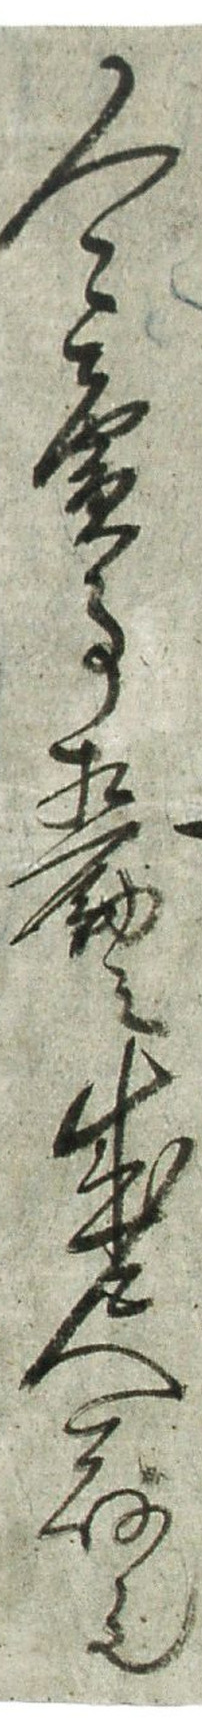人々売事相励み成尺荷主
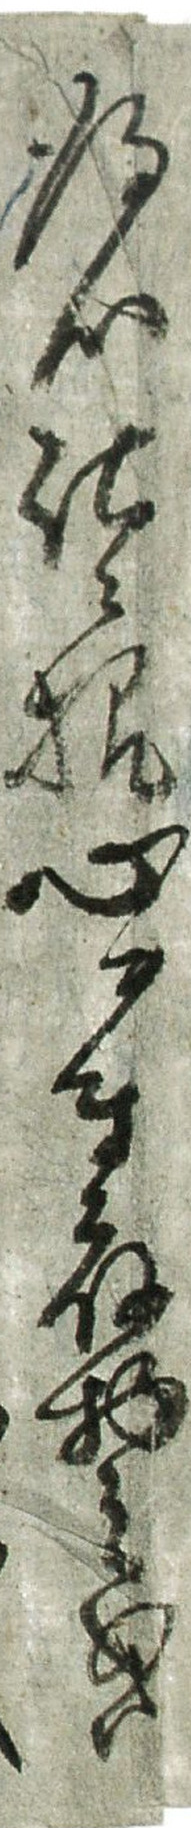得心仕候様心を付荷物之義は
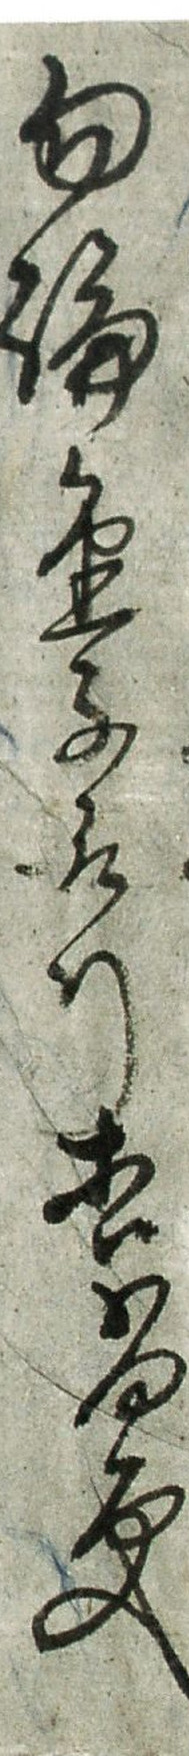勿論金子取引等は尚更
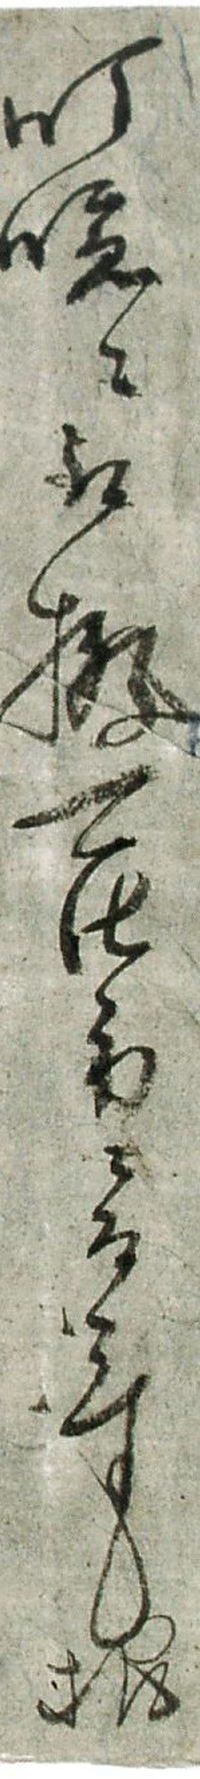叮嚀に取扱可仕方にて御座候様
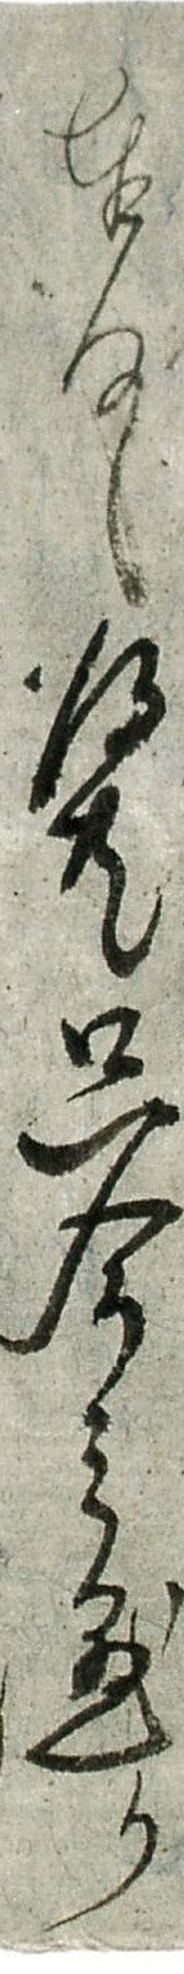奉存候得共只今之懸り
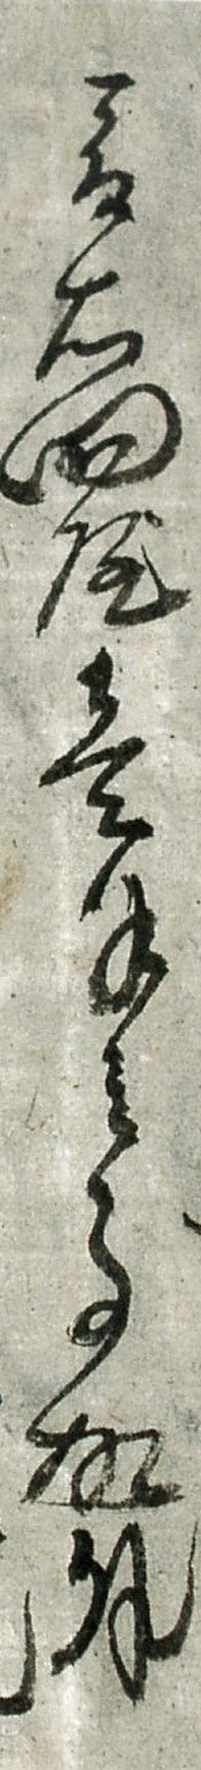にて右問屋壱手之事故外
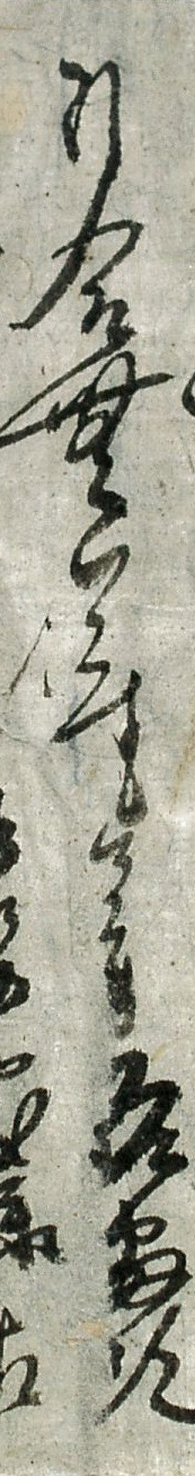引合無御座候に付各番頭
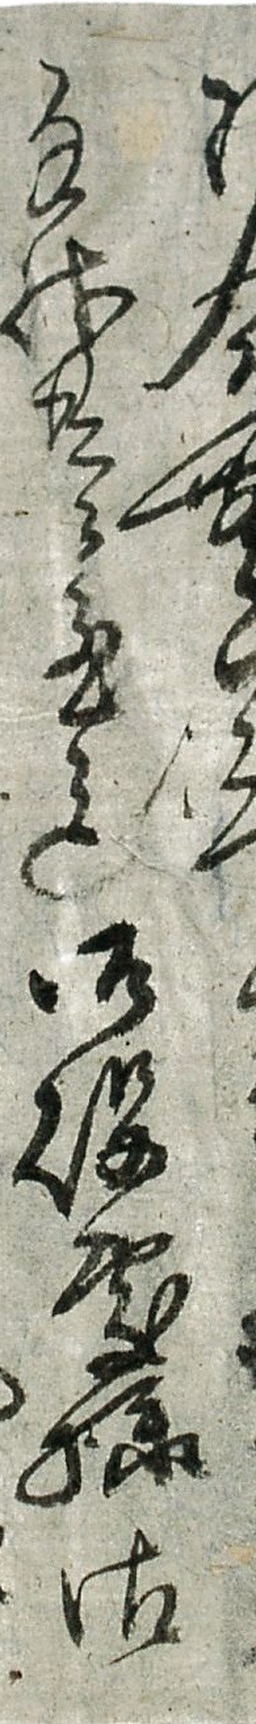手代共に至迄御役処様御
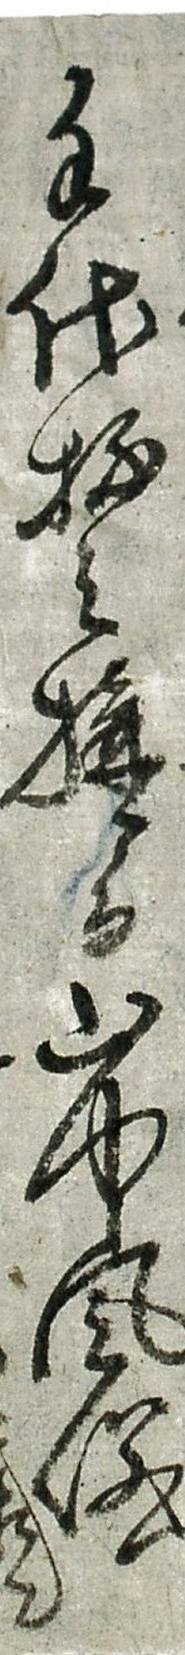手代抔之構にて山中風儀は
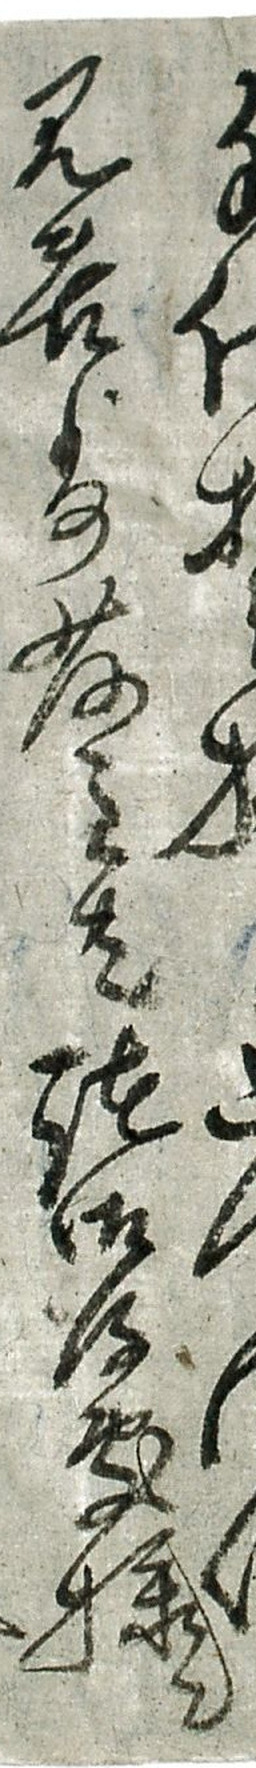見苦布荷主共諸御役処様に
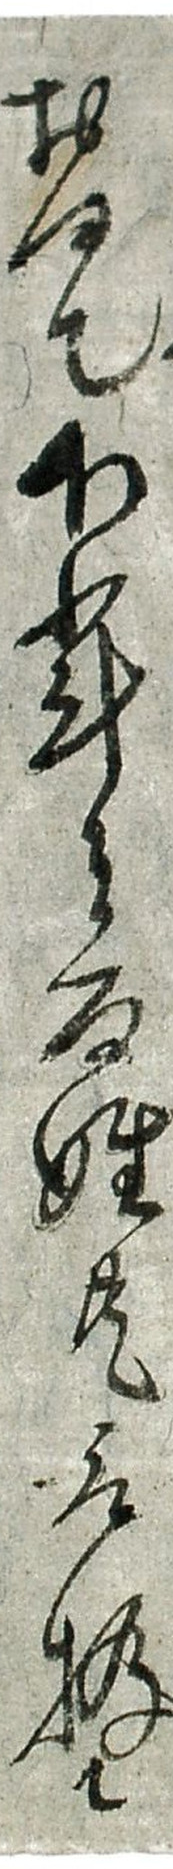おゐて下輩之百姓共取扱も
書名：(美馬三好両郡百姓共煙草問屋壱手勘定ニ相成迷惑願右始末承申上書付之写）
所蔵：鳴門教育大学 Naruto University of Education
